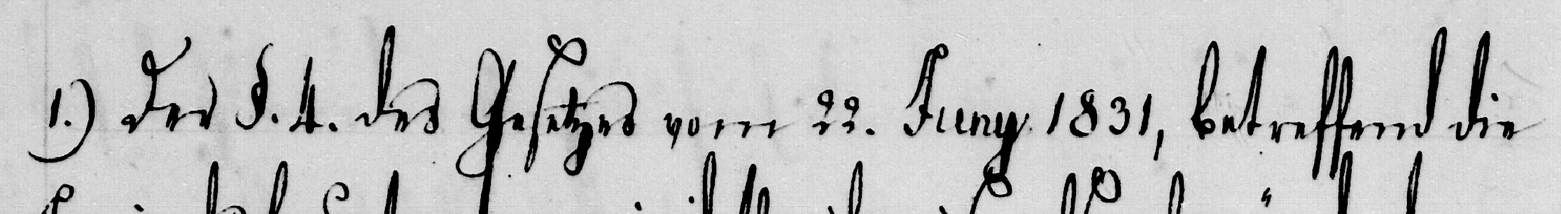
1.) Der §. 4. des Gesetzes vom 22. Juny 1831, betreffend die
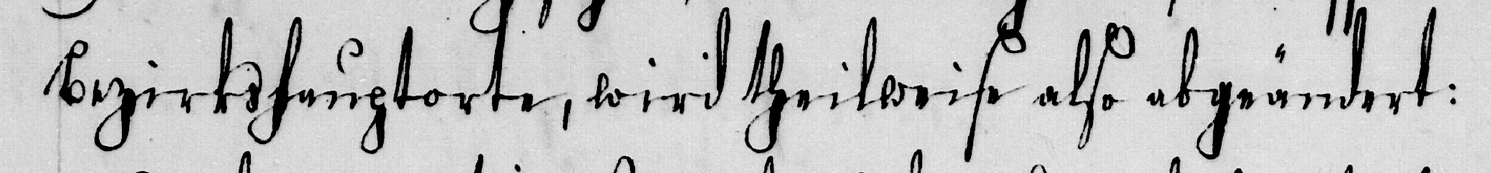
Bezirkshauptorte, wird theilweise also abgeändert:
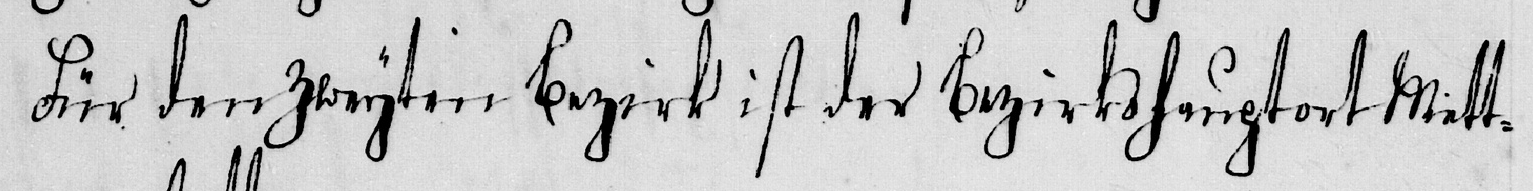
Für den zweyten Bezirk ist der Bezirkshauptort Mett¬
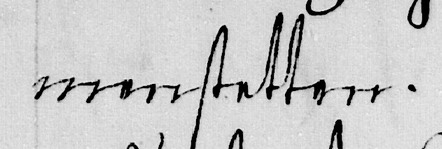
menstetten.
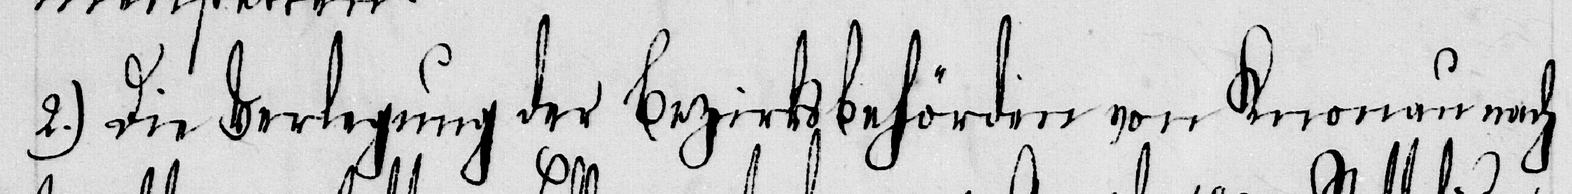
2.) Die Verlegung der Bezirksbehörden von Knonau nach
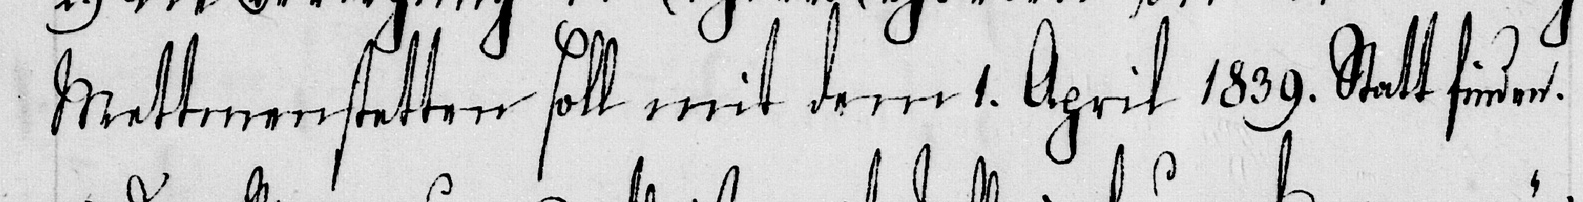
Mettmenstetten soll mit dem 1. April 1839. Statt fin¬
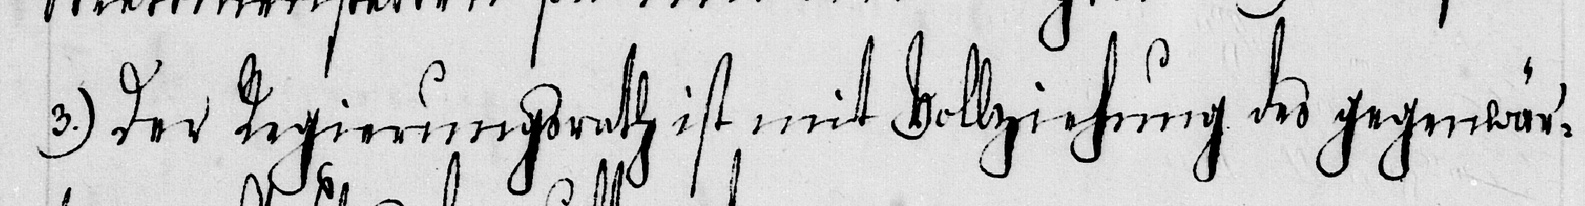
3.) Der Regierungsrath ist mit Vollziehung des gegenwär¬
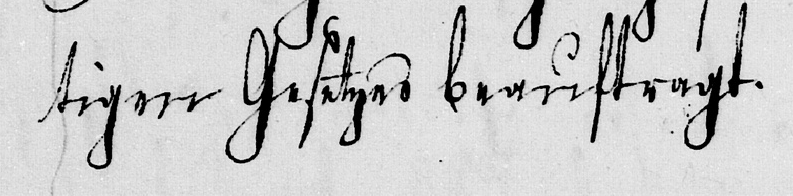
tigen Gesetzes beauftragt.
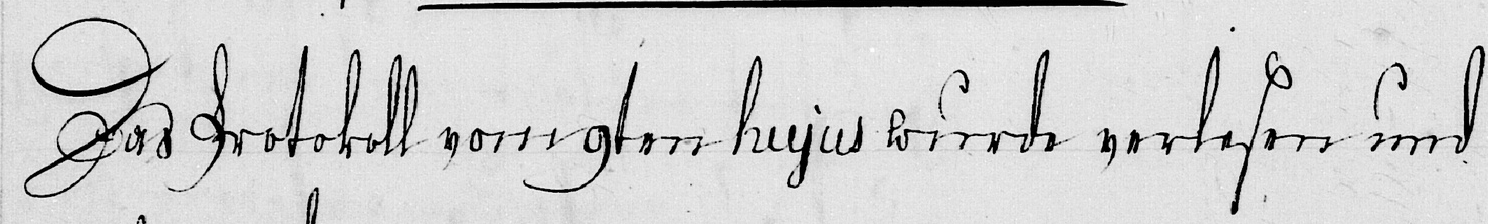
Das Protokoll vom 9ten hujus wurde verlesen und
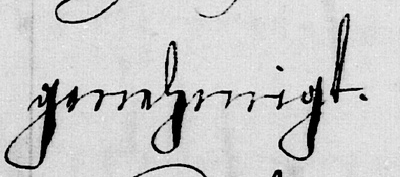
genehmigt.
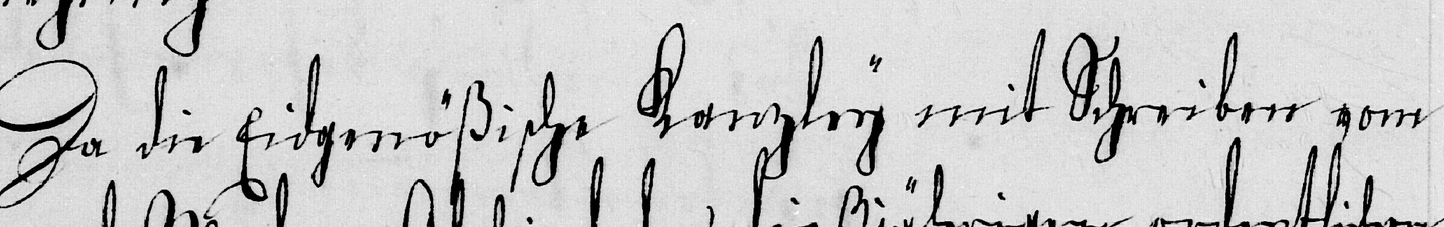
Da die Eidgenößische Kanzley mit Schreiben vom
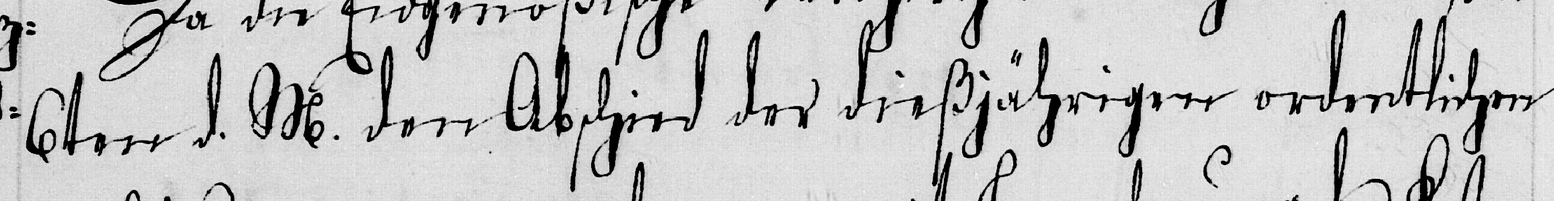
6ten d. M. den Abschied der dießjährigen ordentlichen
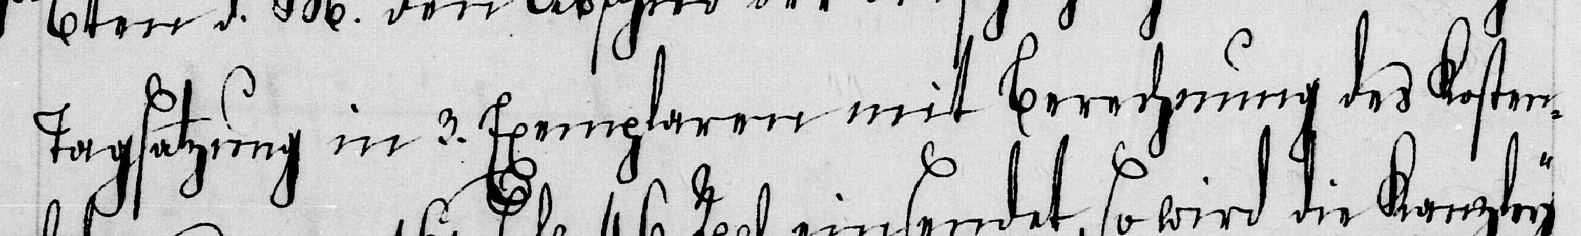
Tagsatzung in 3. Exemplaren mit Berechnung des Kosten¬
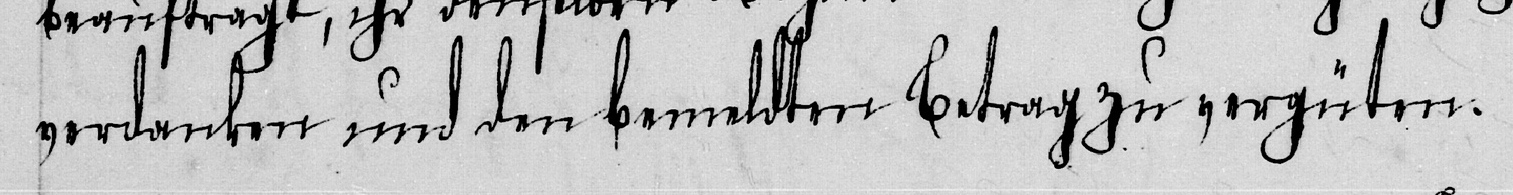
verdanken und den bemeldten Betrag zu vergüten.
